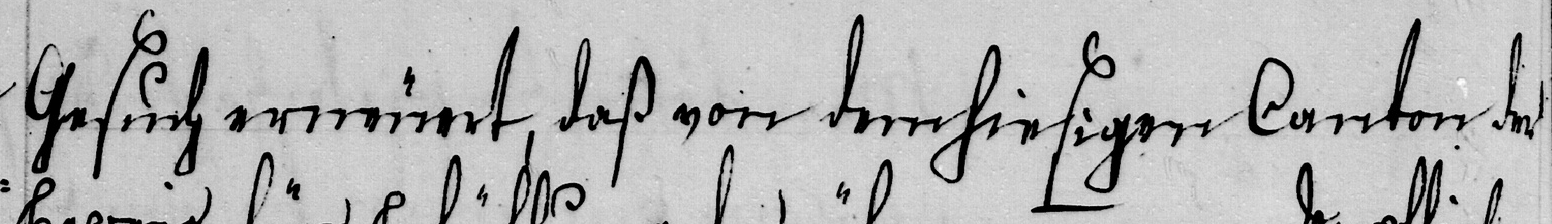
Gesuch erneuert, daß von dem hiesigen Canton d¬
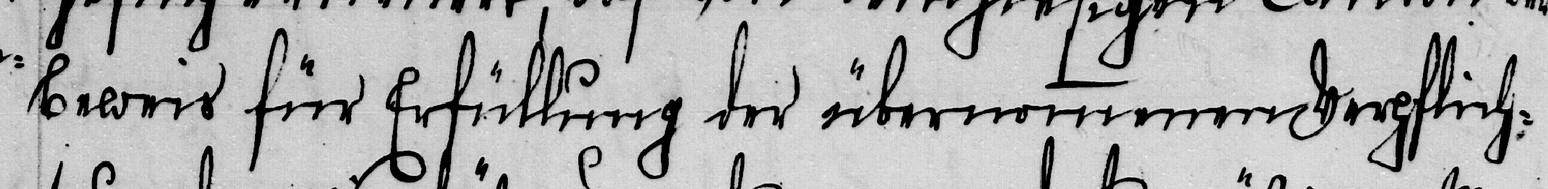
Beweis für Erfüllung der übernommenen Verpflich¬
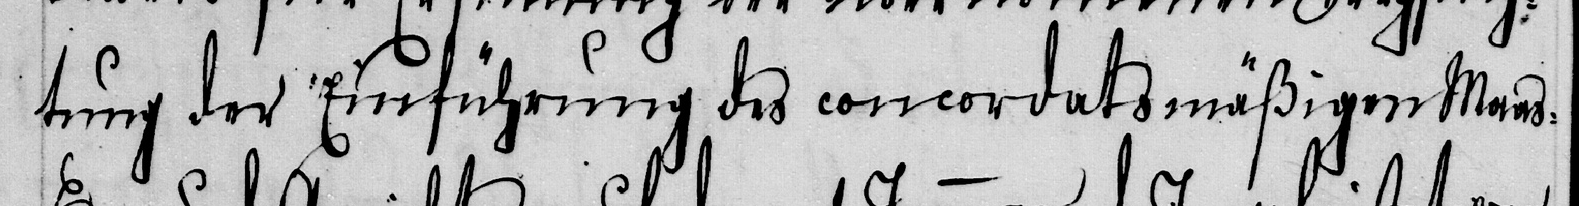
tung der Einführung des concordatsmäßigen Maaß¬
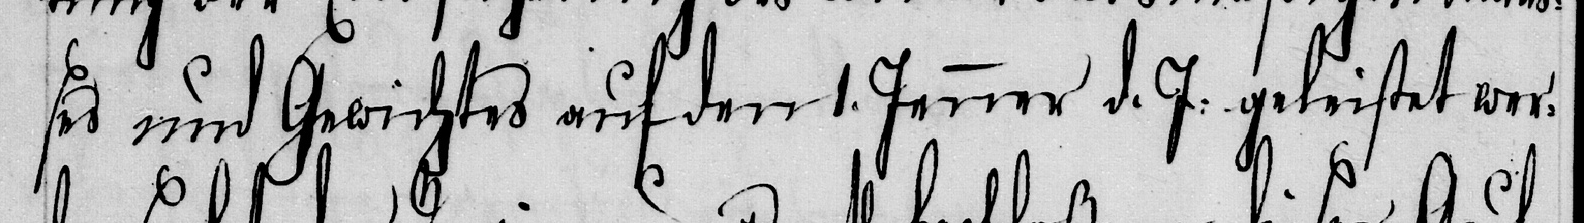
es und Gewichtes auf den 1. Jenner d. J. geleistet wer¬
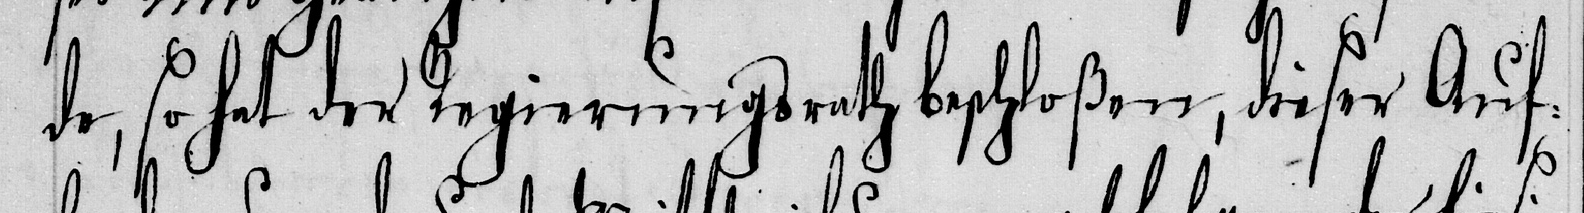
de, so hat der Regierungsrath beschloßen, dieser Auf¬
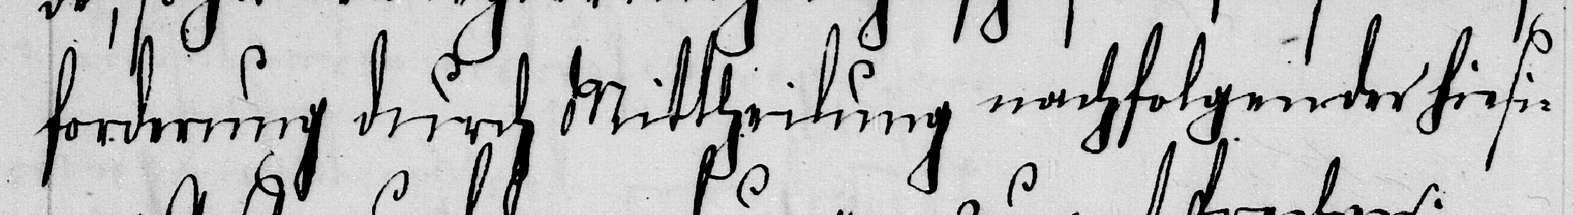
forderung durch Mittheilung nachfolgender hiesi¬
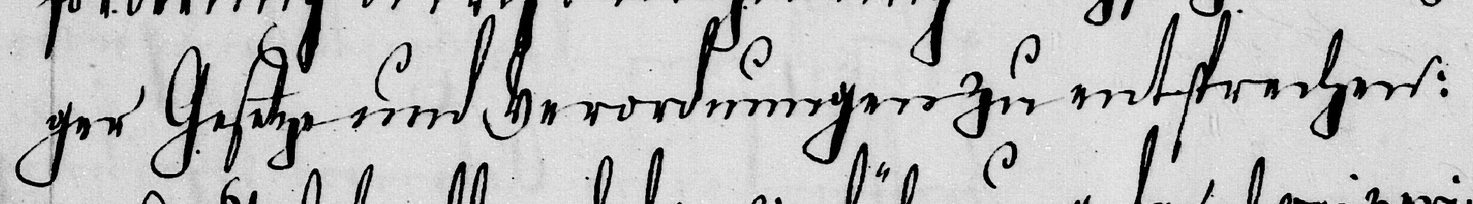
ger Gesetze und Verordnungen zu entsprechen:
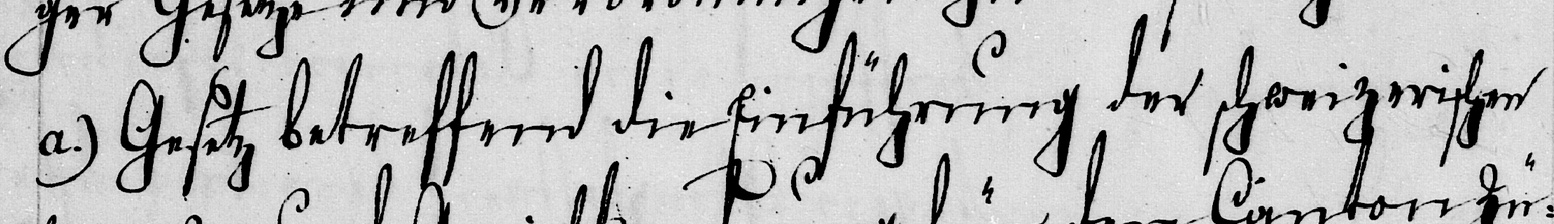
a.) Gesetz betreffend die Einführung der schweizerisc¬
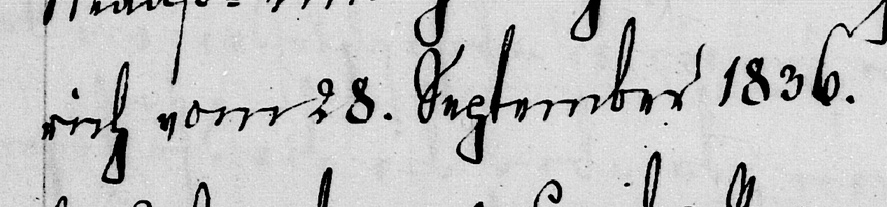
rich vom 28. September 1836.
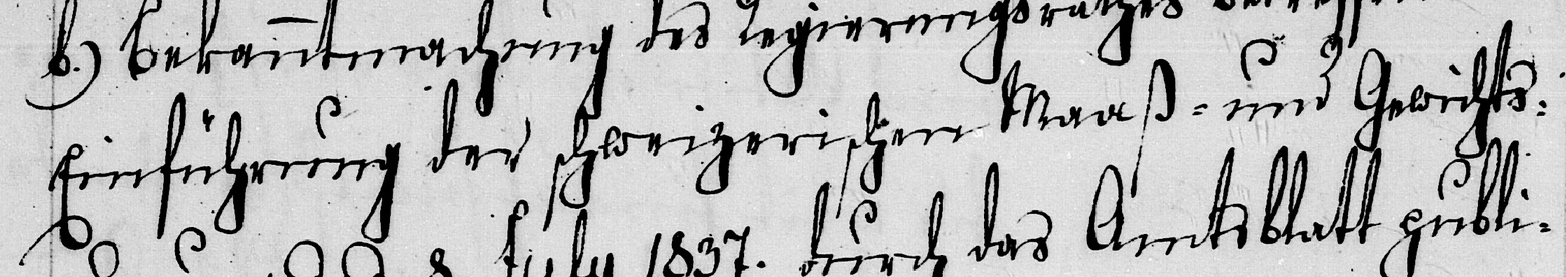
Einführung der schweizerischen Maaß - und Gewichts¬
